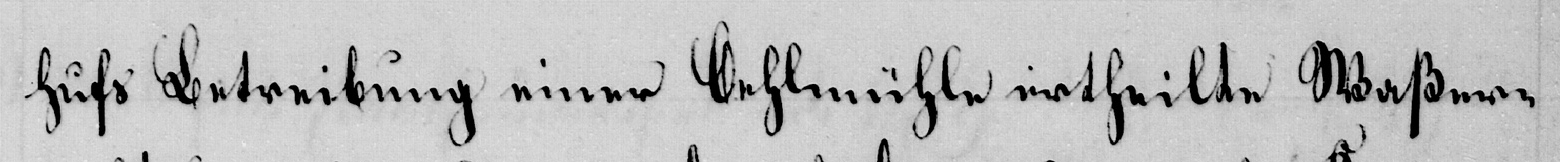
hufs Betreibung einer Oehlmühle ertheilte Waßer¬
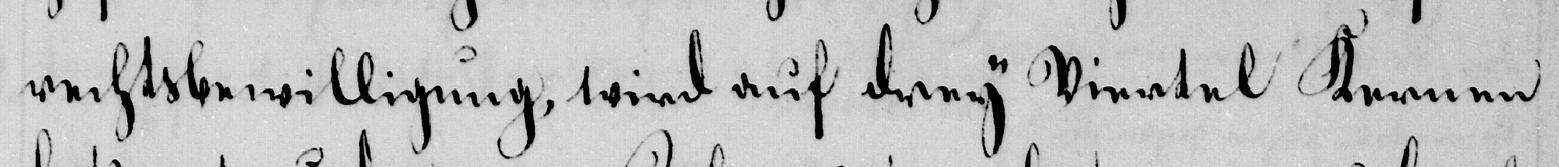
rechtsbewilligung, wird auf drey Viertel Kernen
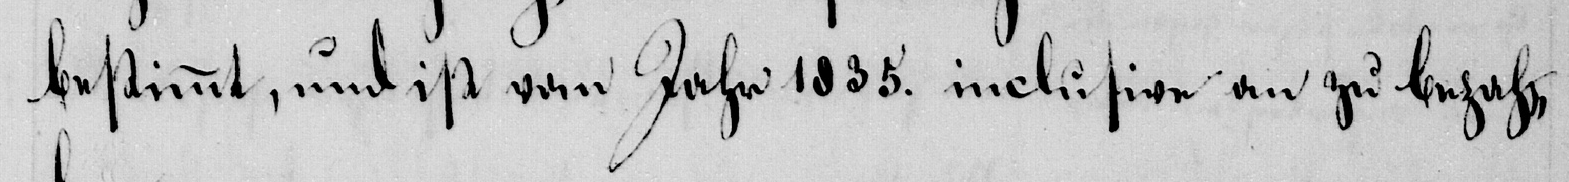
bestimmt, und ist vom Jahr 1835. inclusive an zu bezah¬
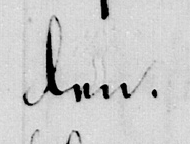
len.
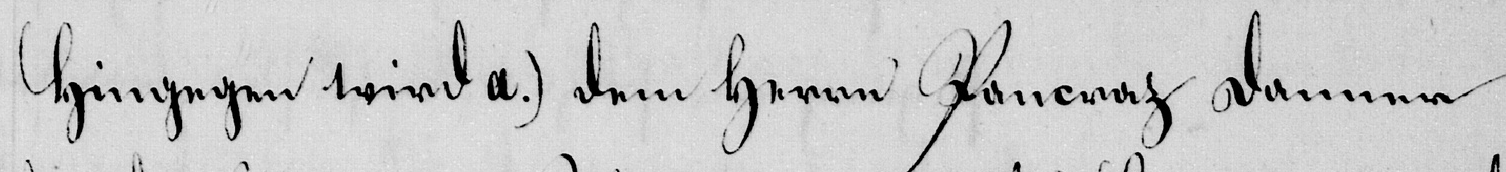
Hingegen wird a.) dem Herrn Pancraz Danner
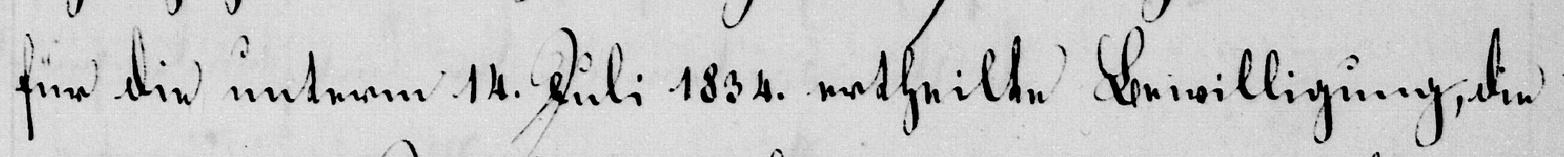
für die unterm 14. Juli 1834. ertheilte Bewilligung, die
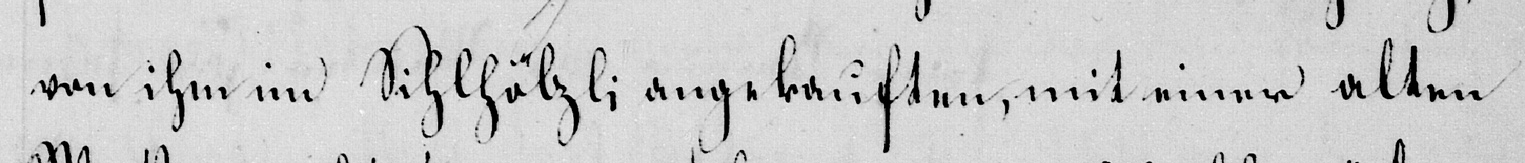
von ihm im Sihlhölzli angekauften, mit einer alten
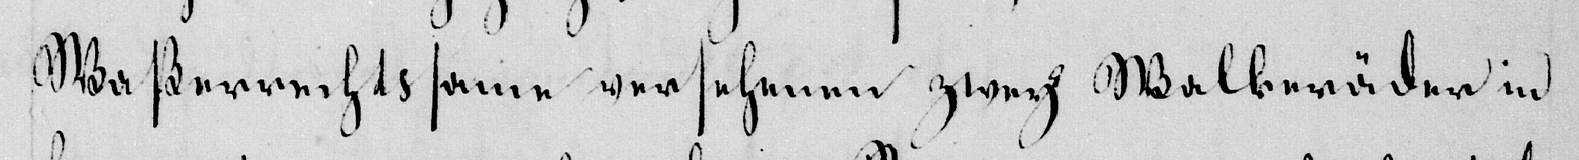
Waßerrechtsame versehenen zwey Walkräder in
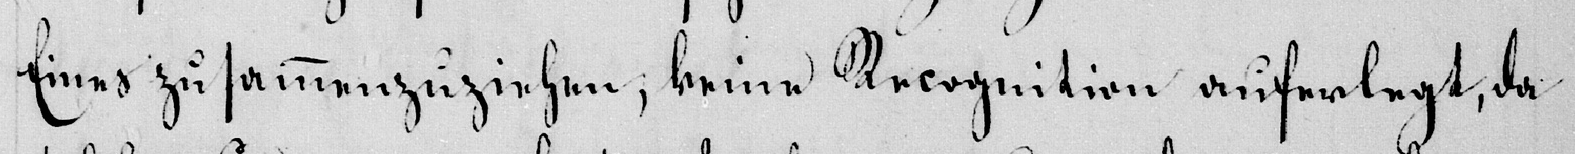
Eines zusammenzuziehen, keine Recognition auferlegt, da
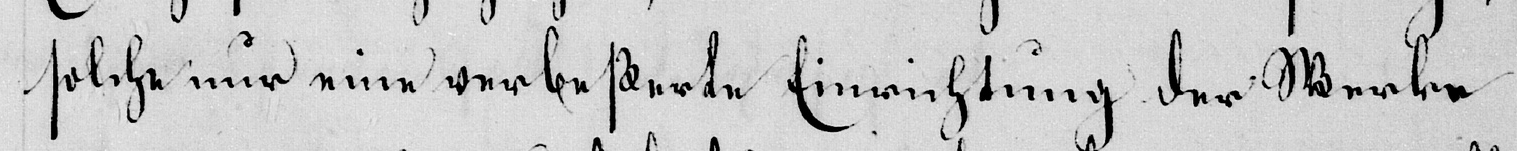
solche nur eine verbeßerte Einrichtung der Werke
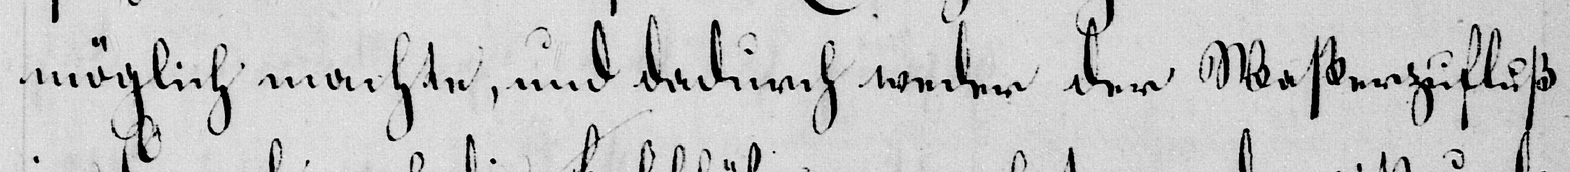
möglich machte, und dadurch weder der Waßerzufluß
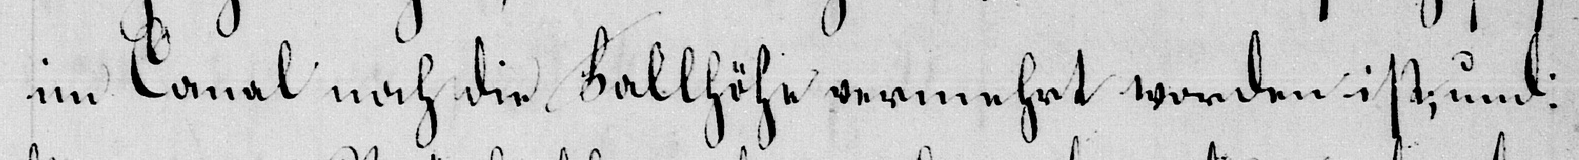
im Canal noch die Fallhöhe vermehrt worden ist, und:
